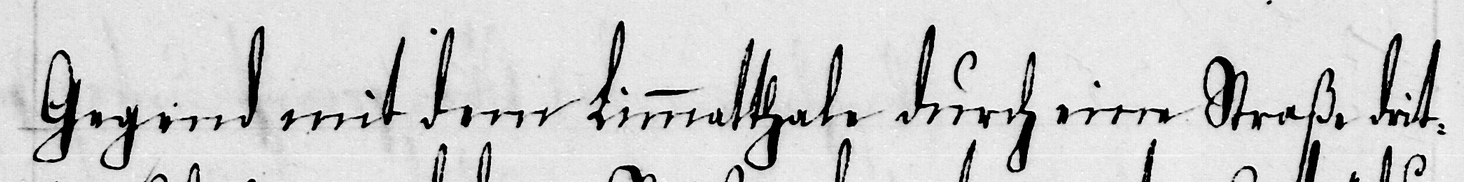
Gegend mit dem Limmatthale durch eine Straße drit¬
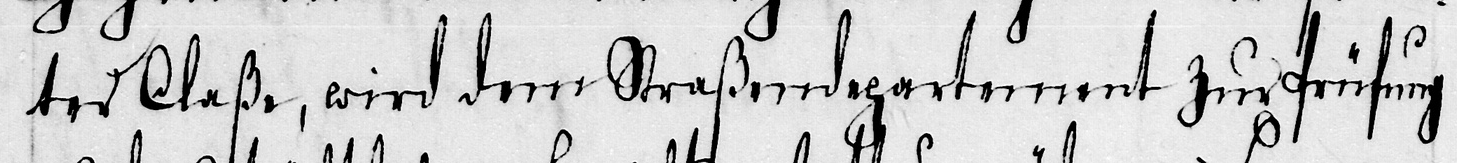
ter Claße, wird dem Straßendepartement zur Prüfung
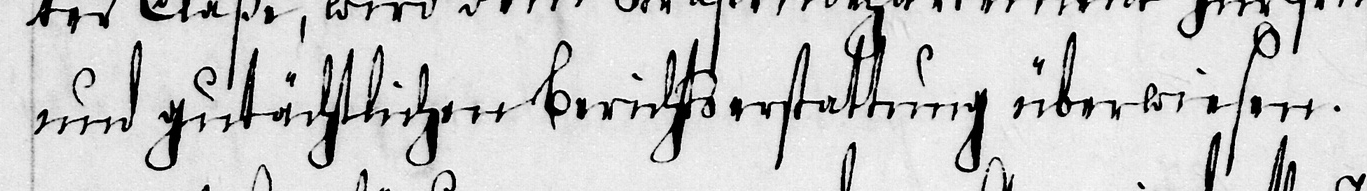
und gutächtlichen Berichtserstattung überwiesen.
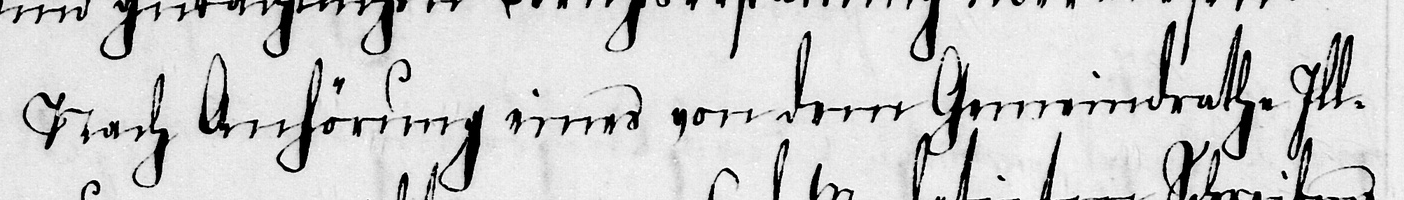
Nach Anhörung eines vom dem Gemeindrathe Ill¬
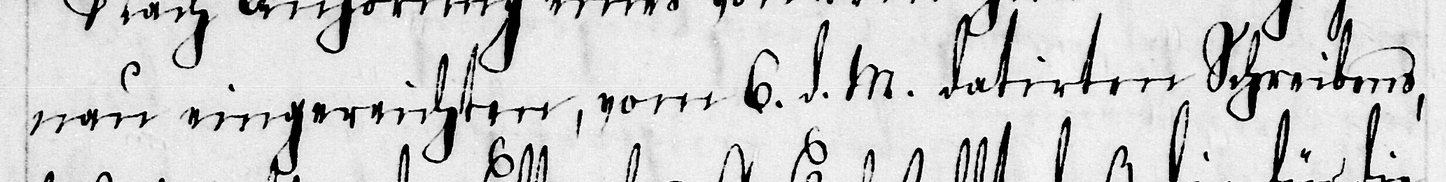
nau eingereichten, vom 6. d. M. datirten Schreibens,
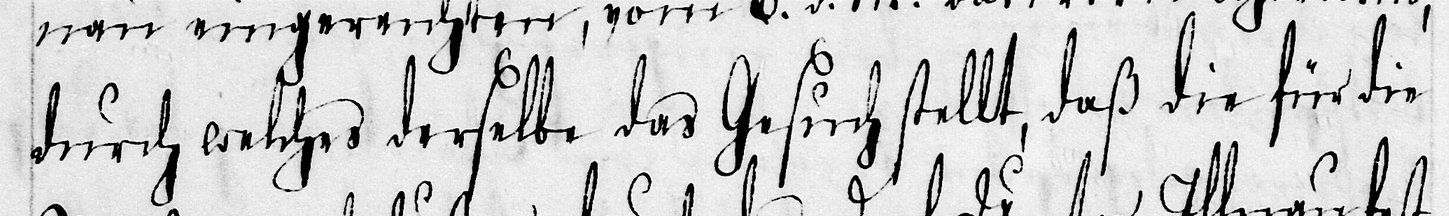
durch welches derselbe das Gesuch stellt, daß die
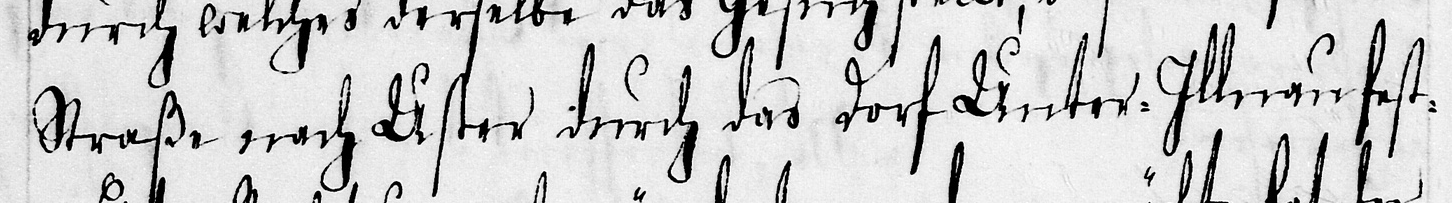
Straße nach Uster durch das Dorf Unter-Illnau fest¬
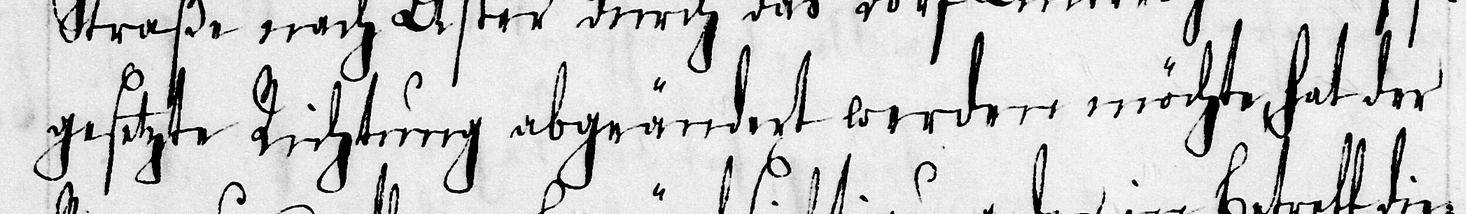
gesetzte Richtung abgeändert werden möchte, hat der
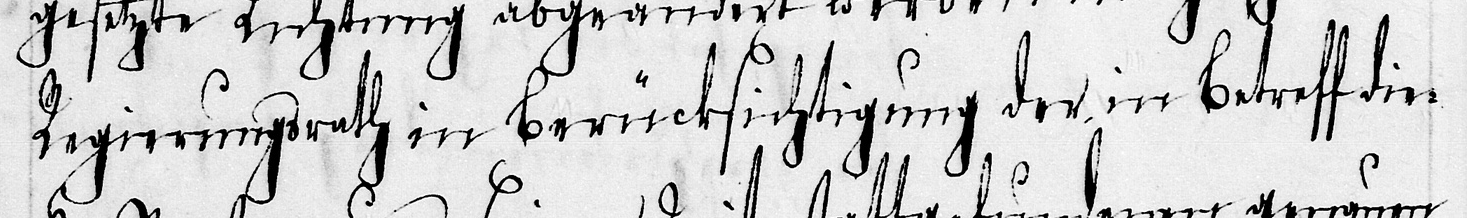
Regierungsrath in Berücksichtigung der in Betreff die¬
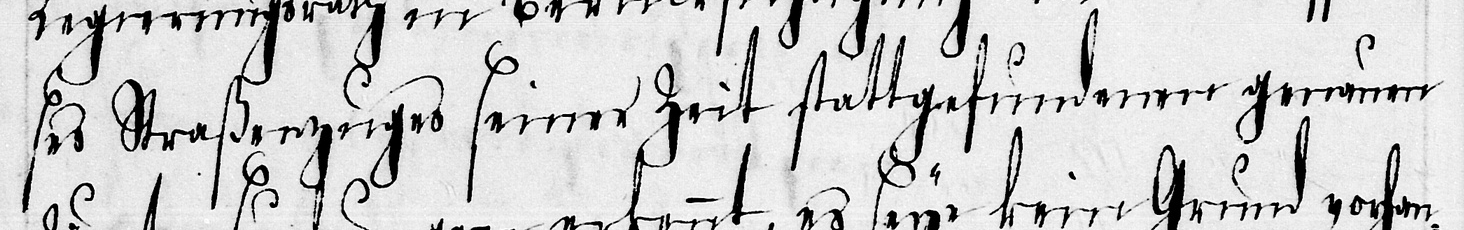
ses Straßenzuges seiner Zeit stattgefundenen genauen
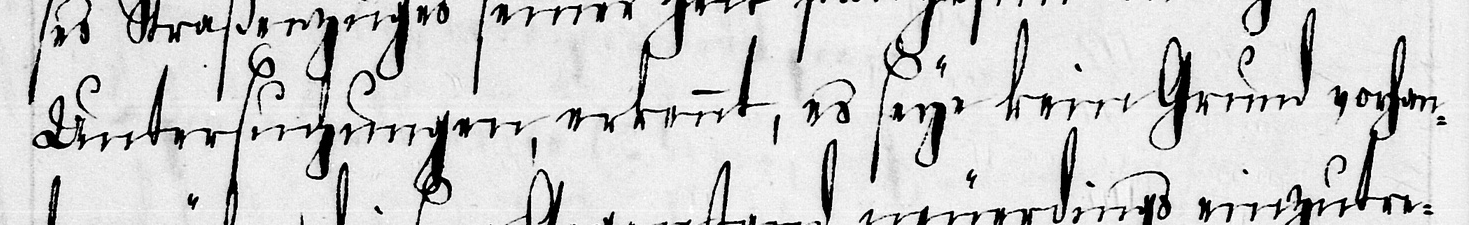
Untersuchungen, erkennt, es seye kein Grund vorhan¬
